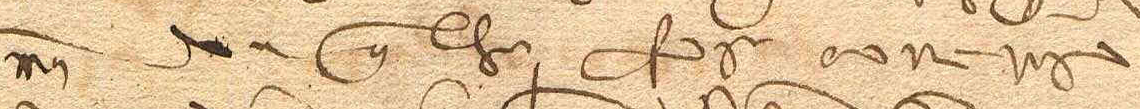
madou q̄ lhe fose concruso
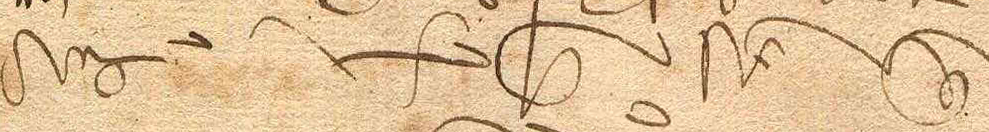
Anto Roj̄z o sp̄vy
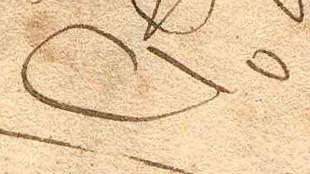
Co
